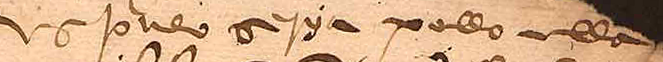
esp̅veo serya pello ella
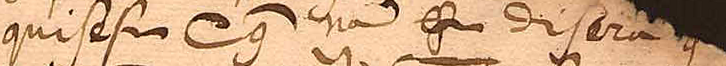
quisese e q̅ na̅ lhe disera q
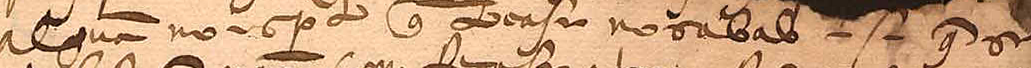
algu̅a no esp̅to q̅ tocase no sabado .s. q̅ se
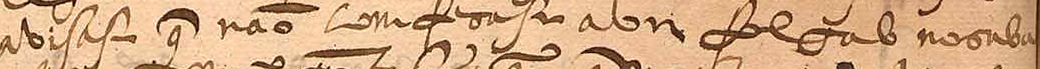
avisase q̅ não comfesase aver folgado no saba
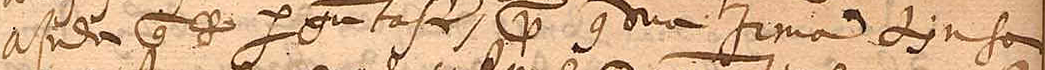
aJnda q̅ lhe ꝑgu̅tase̅ / p̄o q̅ sua Jrma̅ tynha
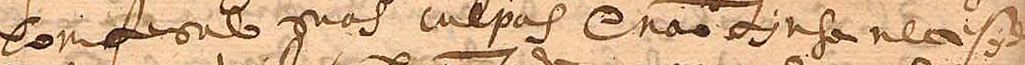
Comfesado suas culpas e não tinha necesyd
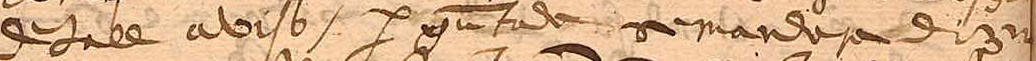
de tall aviso / ꝑgu̅tada se mandara dizer
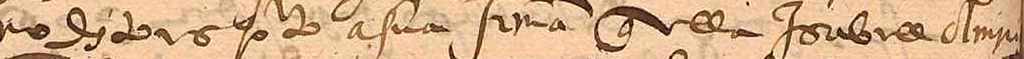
no dito esp̅ito a su̅a Jrma̅ q̅ ella Jsabell Amri
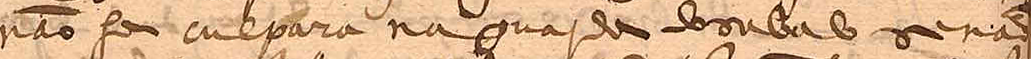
não ha culpara na guarda do sabado senão
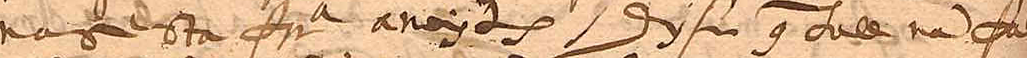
na sesta frra a noytꝭ / dyse q̅ tall na̅ fa
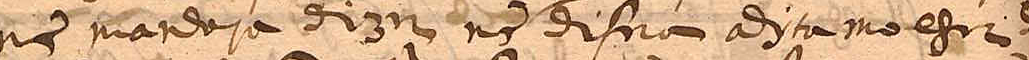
ne̅ mandara dizer ne̅ disera a dyta molher
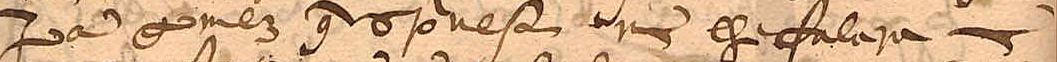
Joa̅ gomez q̅ esp̅uese ne̅ lhe falara e̅
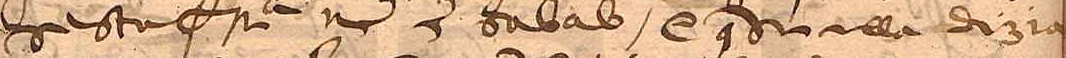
sesta frra ne̅ e̅ sabado / e q̅ se ella dizia
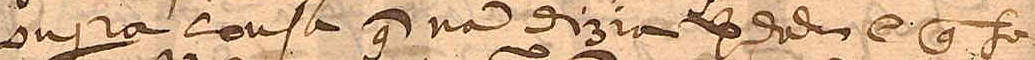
outra cousa q̅ na̅ dizia ꝟdade e q̅ ha
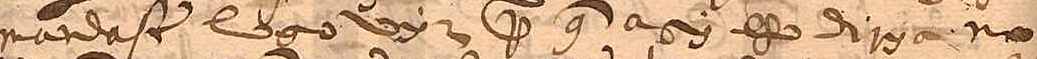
mandase̅ logo vyr p̄o q̅ asy lho dirya no
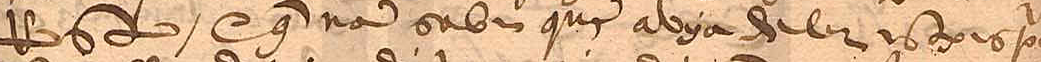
Rosto / e q̅ na̅ sabe quē avya de ler este esp̄i
